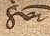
Sōr
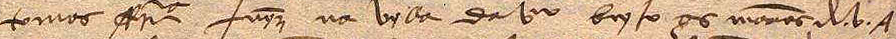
tomas fferrra Juȳz na vylla davro beyJo as maãos de v. A
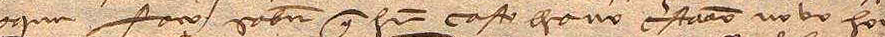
a que faço sab̄er q̄ hū castelhano c̄staão novo homē
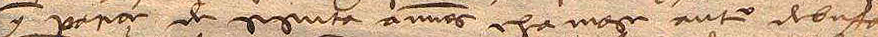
q̄ pareçe de sesenta an̄nos chamase anto de busta
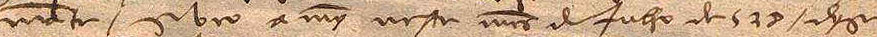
m̄ate / se veo a m̄y neste m̄es de Julho de 538 / dyse
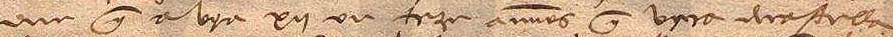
me q̄ avya xij ou treze an̄nos q̄ vyera de castella
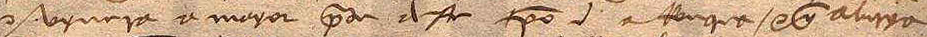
e vyuera a mayor p̄te deste tp̄o ē aRouqua / e q̄ averya
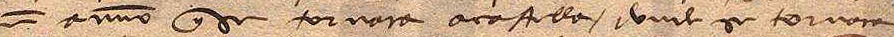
hū an̄no q̄ se tornara a castella / donde se tornara
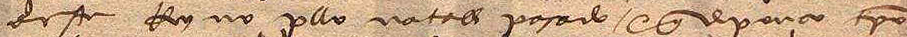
a este Reyno pllo natall pasado / e q̄ de pouco tp̄o
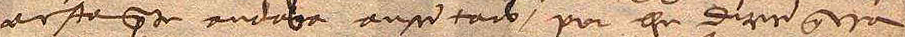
a esta p̄te andava ausētado / por lhe dizerē q̄ era
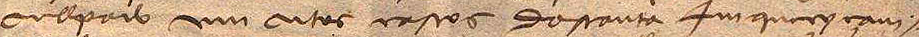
cullpado em certos casos da santa Jmqueçyçam ./.
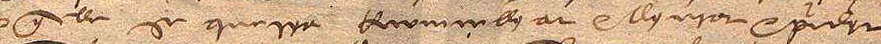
e q̄ elle se querya Recomçellyar e llyurar e pidyr
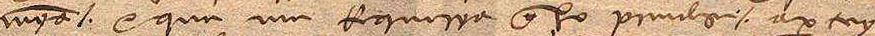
m̄ya ./. e que me Requerya q̄ ho prendese ./. aꝑtey
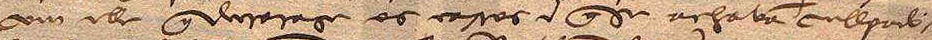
com elle q̄ decrarase os casos ē q̄ se achava cullpado ./.
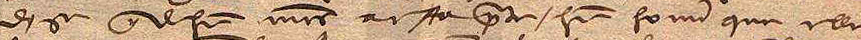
dyse q̄ de hū m̄es a esta p̄te / hū homē que elle
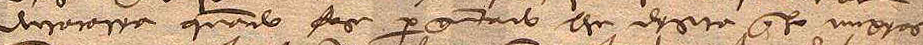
decrararya qūado fose ꝑgūtado lhe dysera q̄ ho mexyas
